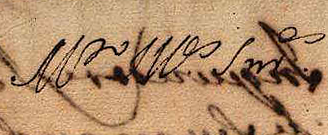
M.to Ill.es Snres.
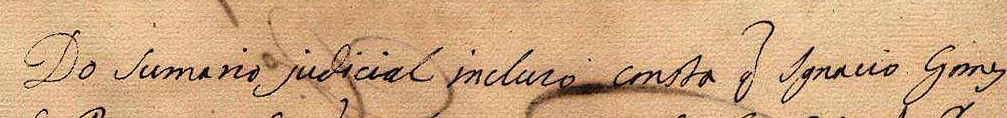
Do sumario judicial incluzo consta q̄ Ignacio Gomes
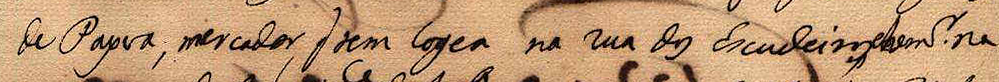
de Payva, mercador q̄ tem logea na rua dos Escudeiros e m.r na
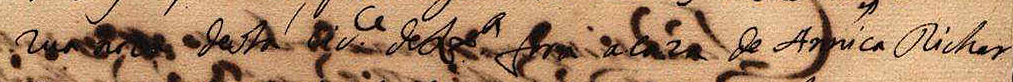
rua nov_ desta cid.e de Lx.a fora a caza de Annica Richar
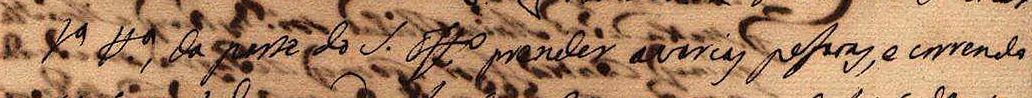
1.a tt.a da parte do S. off.o prender a varias pessoas, e correndo
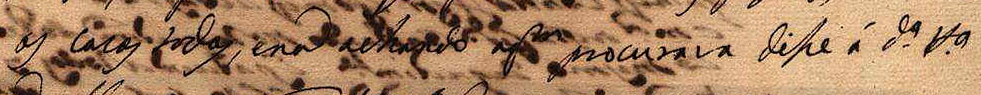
as cazas todas, e naõ achando a q.m procurava disse á d.a tt.a
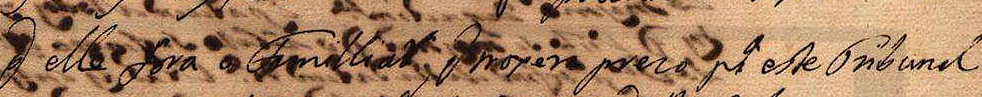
q̄ elle fora o Familiar q̄ troxera prezo pa este Tribunal
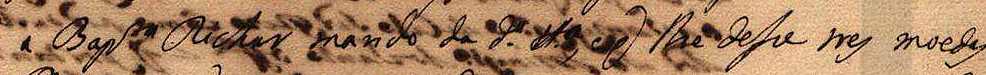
a Bapta Richar marido da d.a tt.a, e q̄ lhe desse tres moedas
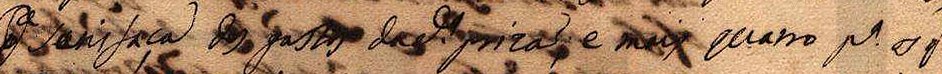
pa satisfaçā dos gastos da d.a prizā, e mais quatro p.a os q̄
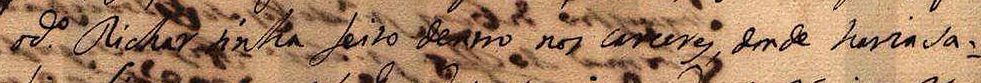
o d.o Richar tinha feito dentro nos carceres, donde havia sa
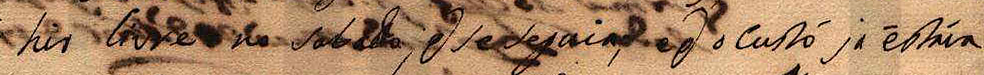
hir livre no sabado, q̄ se seguia e q̄ o custó já estáva
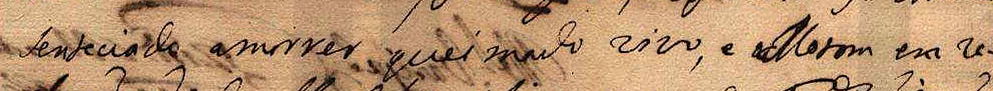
senteciado a morrer queimado vivo, e o Metam em re
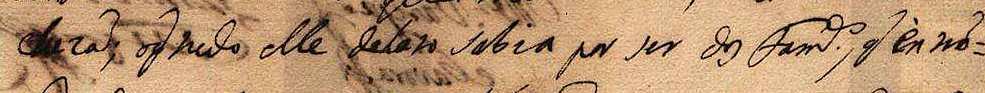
cluzaõ, o q̄ tudo elle delato sabia por ser dos Fam.es, q̄ entrā
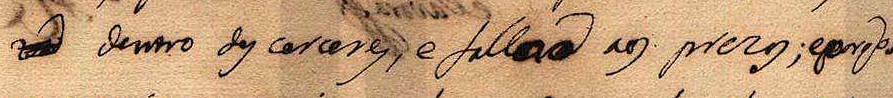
raõ dentro dos carceres, e fallaā aos prezos; e porq̄ o
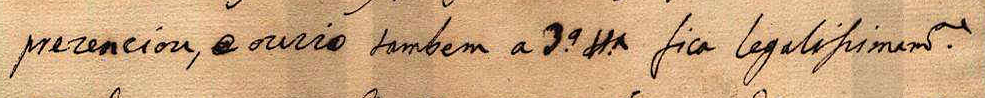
prezenciou, e ouvio tambem a 3.a tt.a fica legalissimam.te
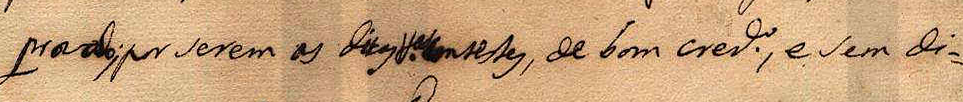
provado; por serem as ditas tt.as contestes, de bom cred.o, e sem di
